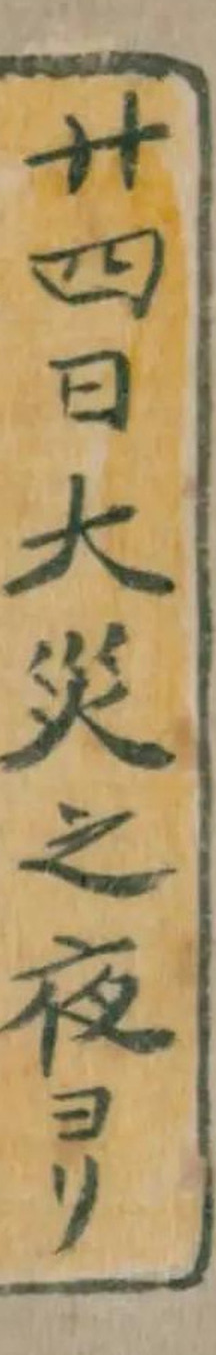廿四日大災之夜ヨリ
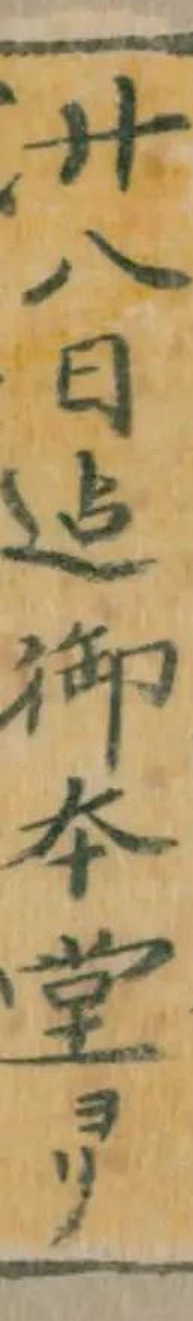廿八日迄御本堂ヨリ
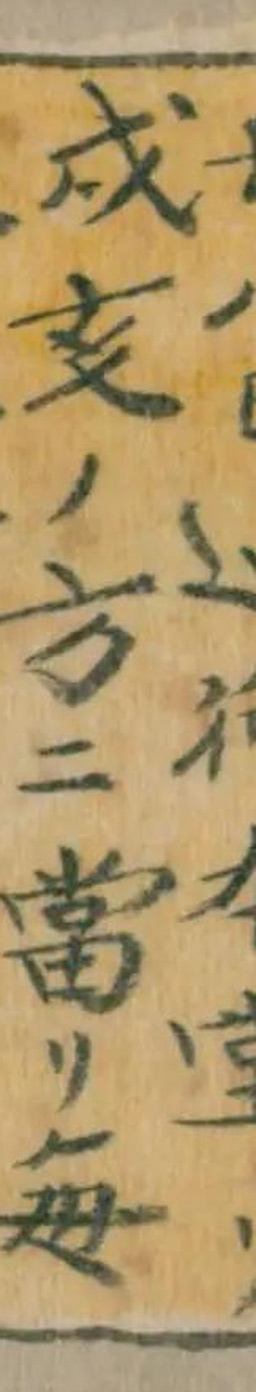戌亥ノ方ニ当リ毎
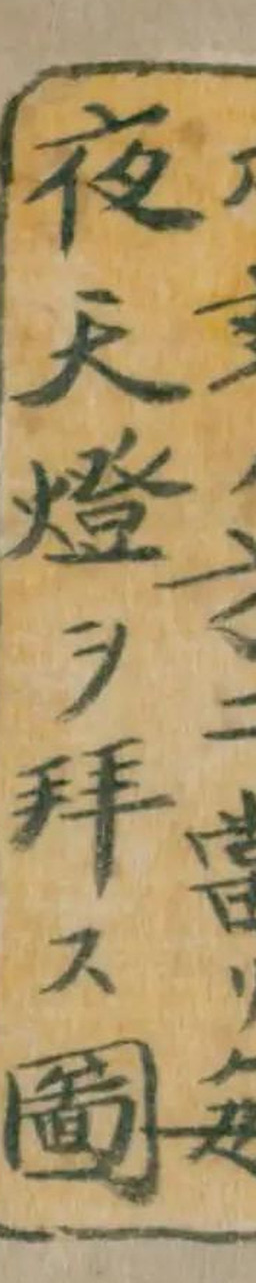夜天燈ヲ拝ス図

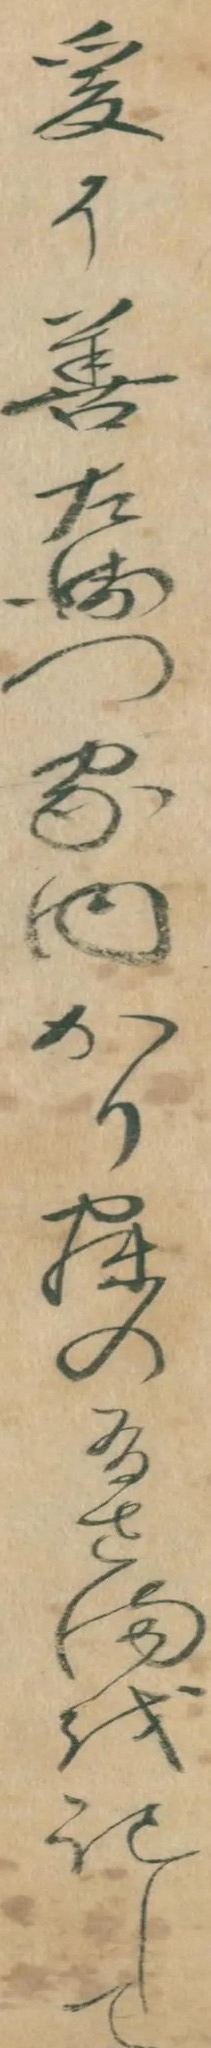爰に善左衛門家内かり宿の有さまを記して
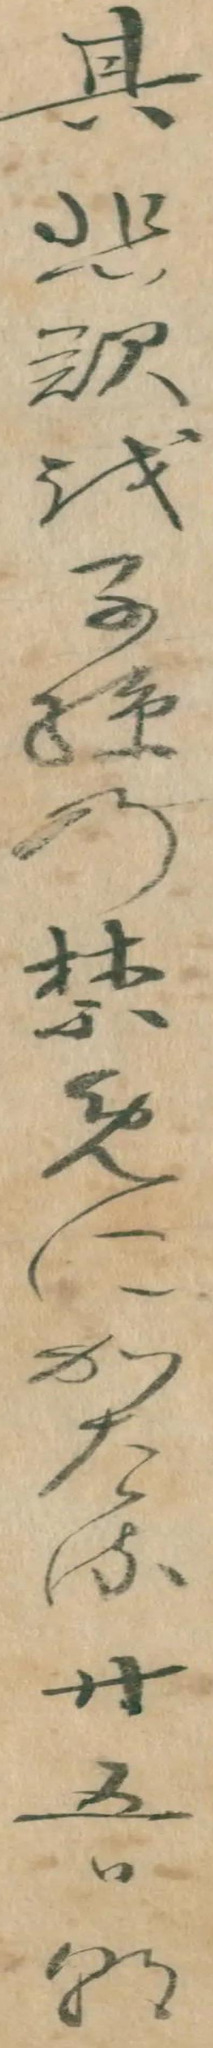其悲歎を子孫の禁めにかたる廿五日朝
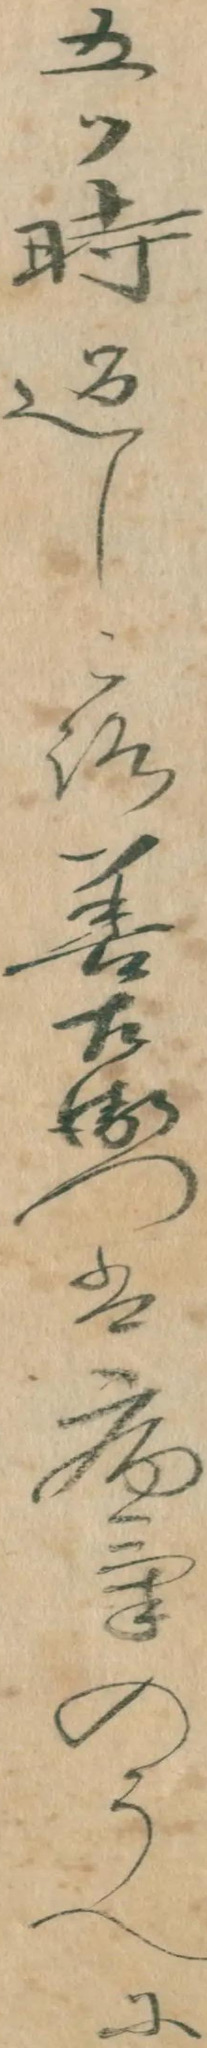五っ時過しころ善左衛門は病気のうへに
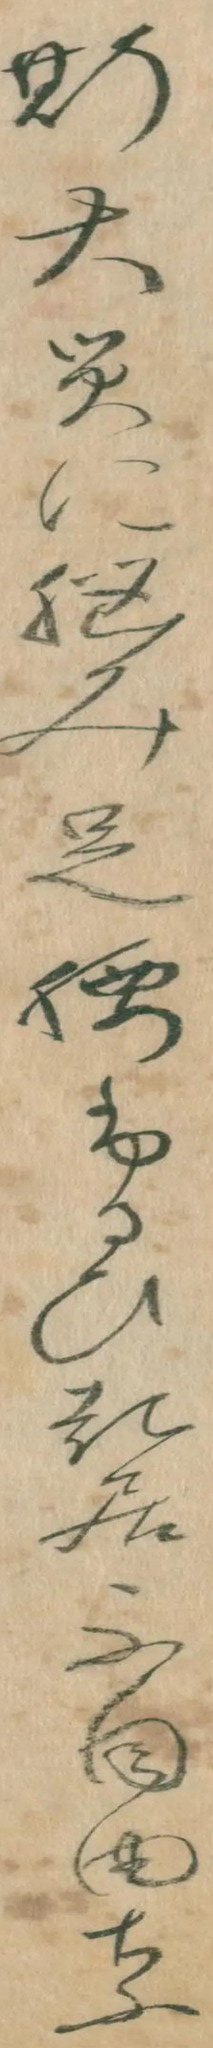斯大災に悩み足腰ふるひ起居不自由な
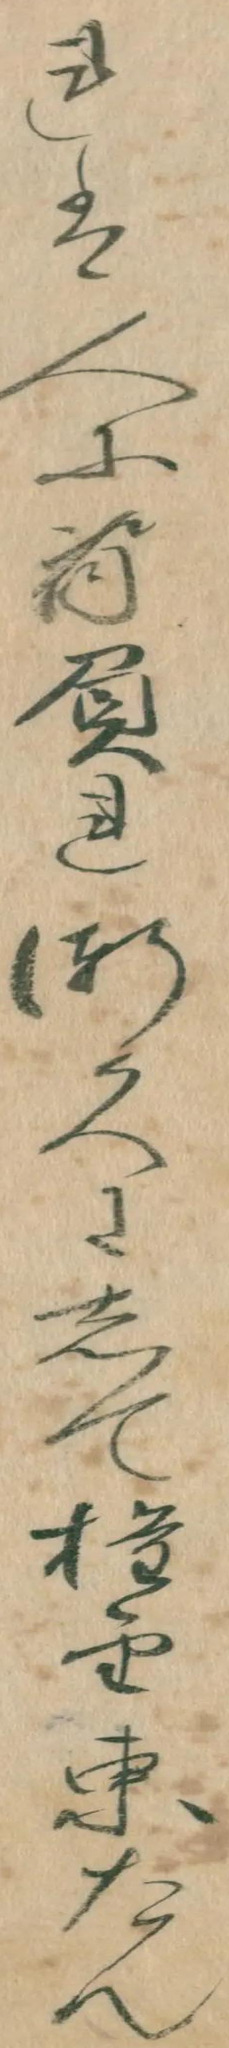れは人に背負れ漸くにして権堂東たん
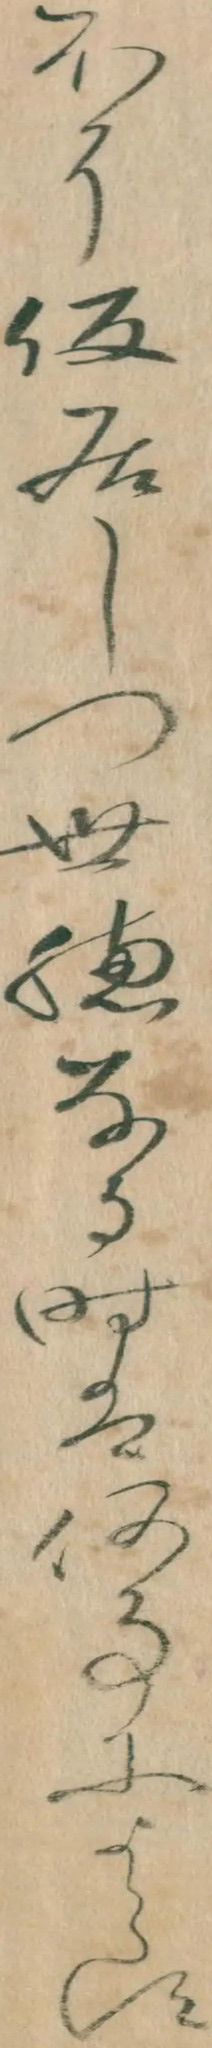ほに仮居しつ世穂なる時は何事によらす
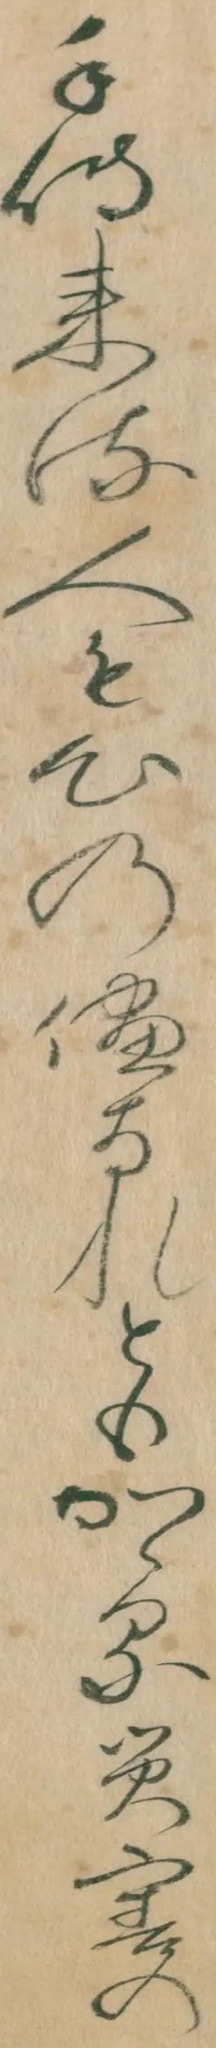手伝来る人も心の儘なれともかゝるに災害の
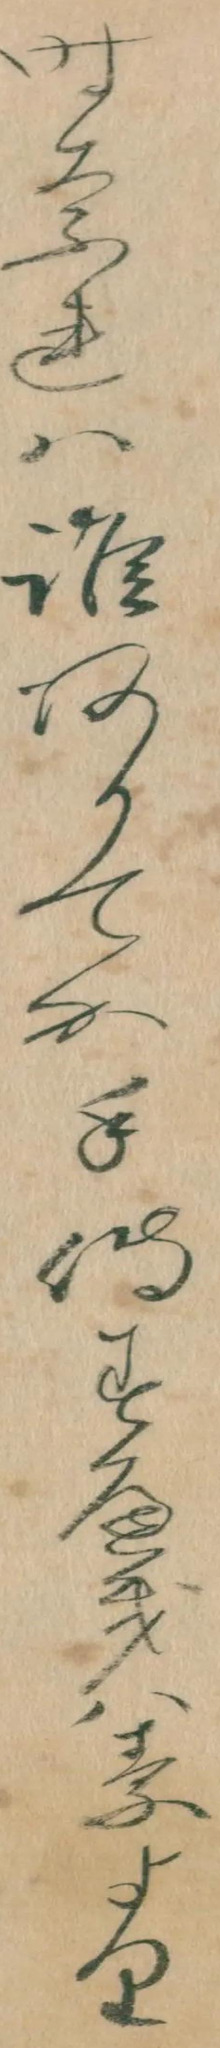時なれは誰ありてか手伝すへきは素より
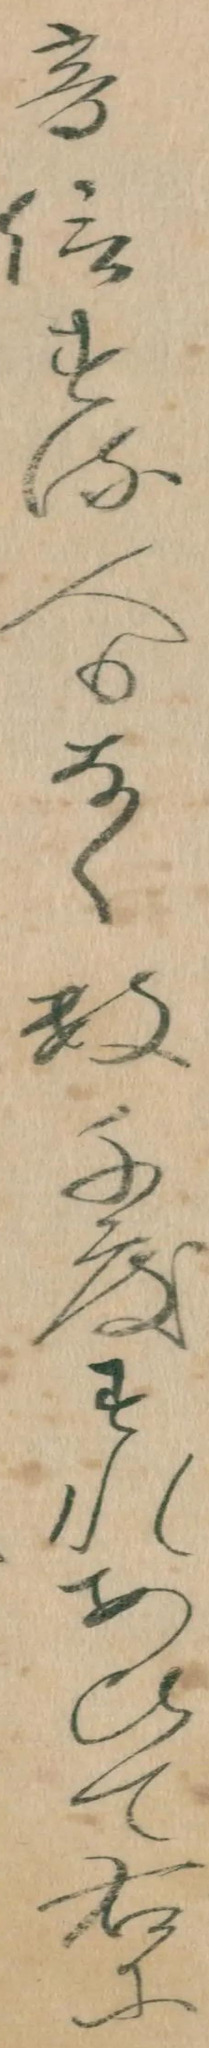音信する人もなく数千度すれあひて右に
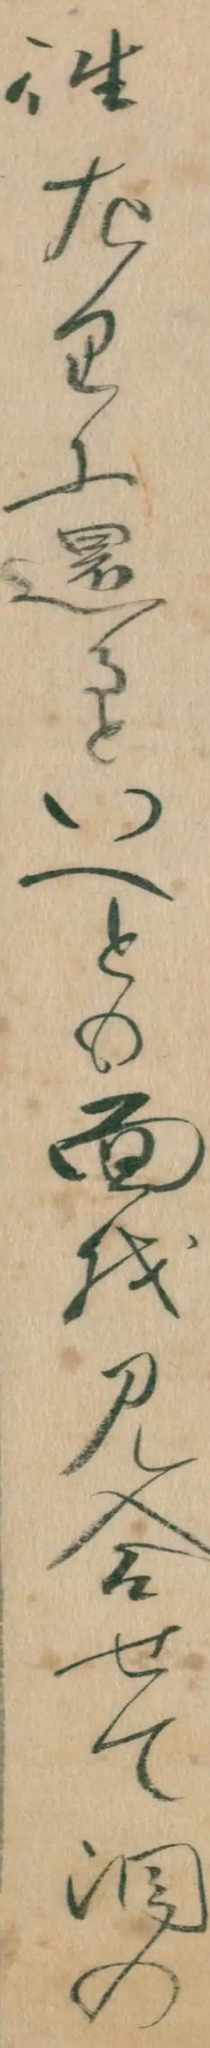往左りに還るといへとも面を見合せて泪の
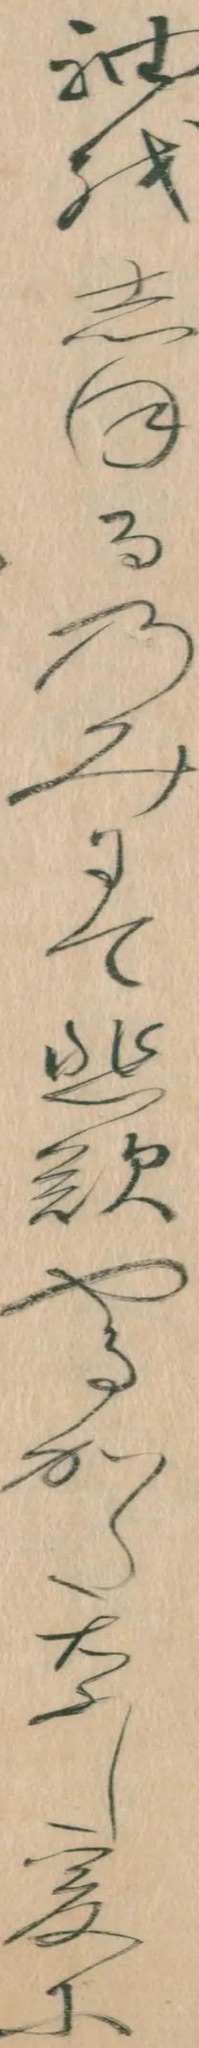袖をしほるのみにて悲歎やるかたなし爰に
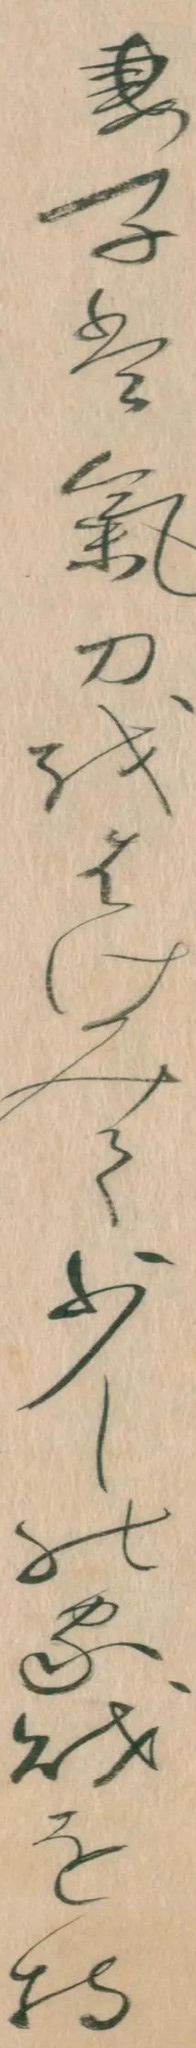妻子は気力をはけみて少しの家財を持
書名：俗語之種. [5]
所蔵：国立国会図書館 National Diet Library, JAPAN
